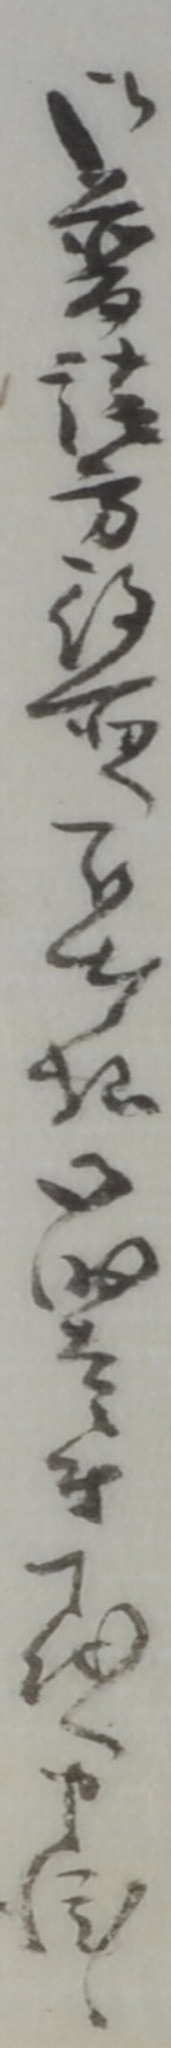御普請方役所へ罷出候様御沙太ニ付丁代へ申渡候
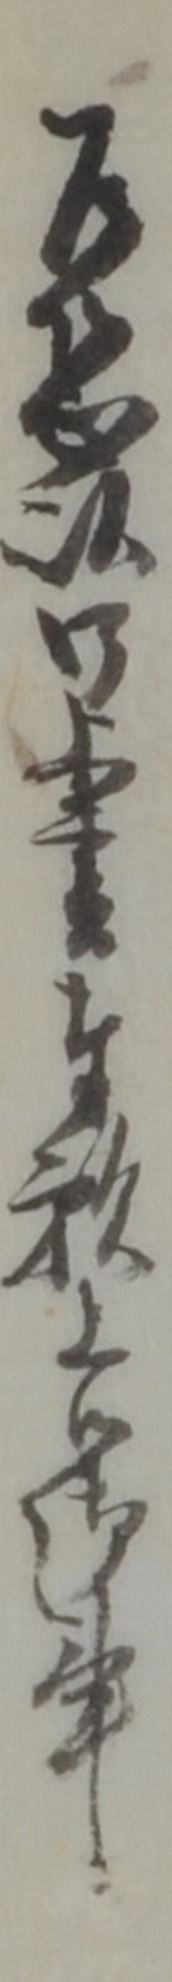乍恐以口上書奉願上候御事
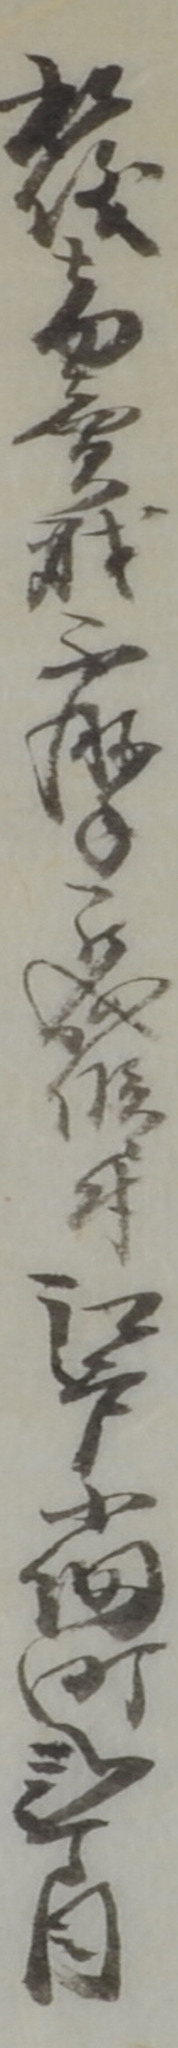私儀商売躰不勝手罷成候ニ付江戸小網町弐丁目
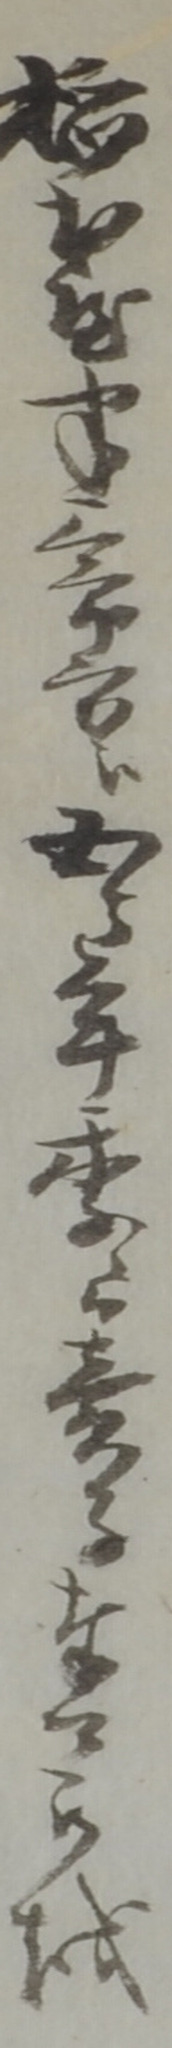橋本屋半三郎方江五ヶ年季ニ而売子奉公罷越
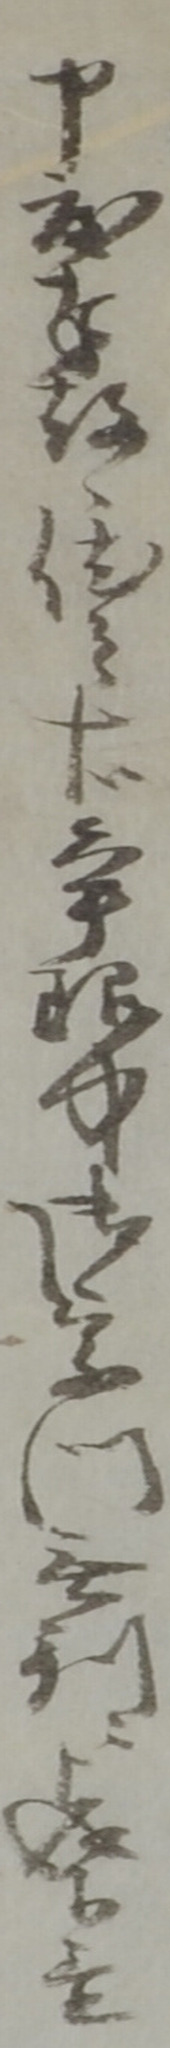申度奉存候依之右年限中御宗門無判ニ被成下置
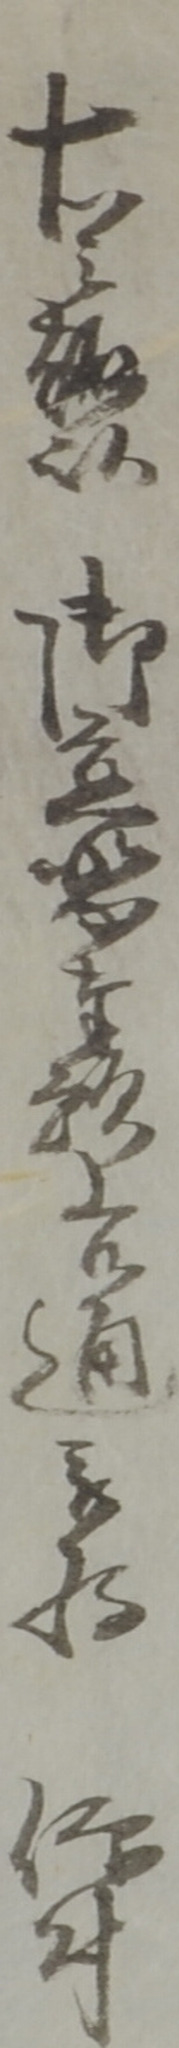右之趣以御慈悲奉願上候通被為仰付
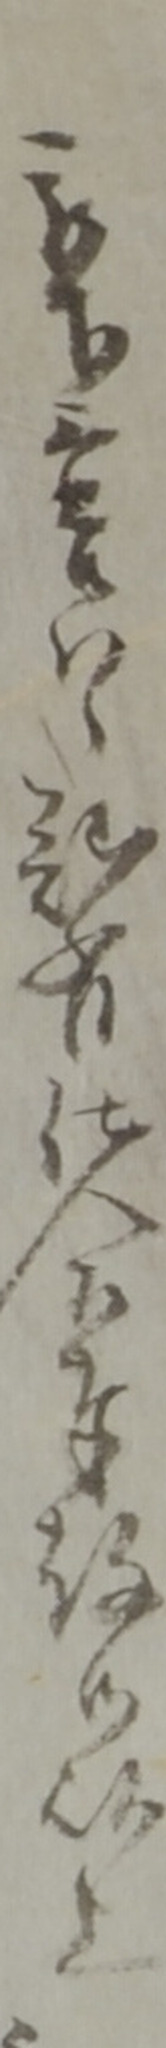被下置候者難有仕合奉存候以上
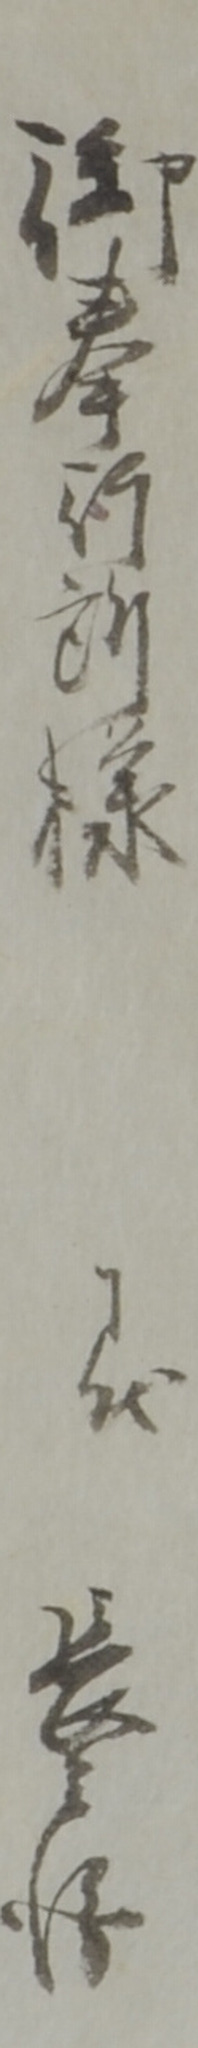御奉行所様丁代長兵衛
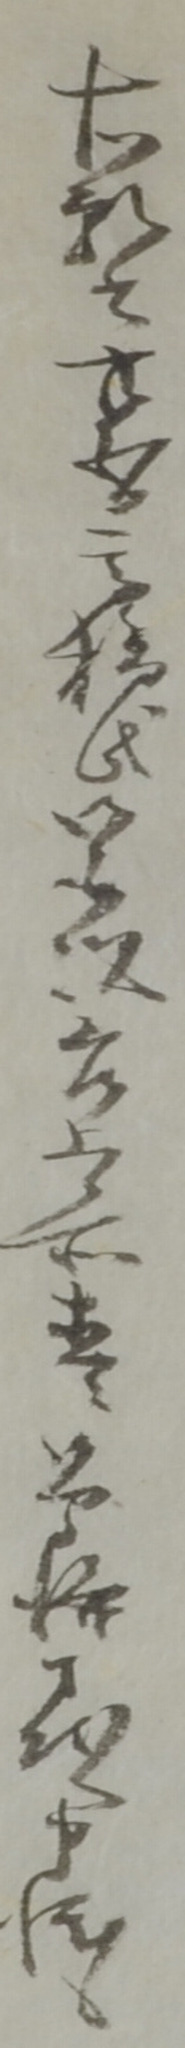右願書廿五日高橋氏御取次差上候所直ニ御聞済丁代へ申渡候

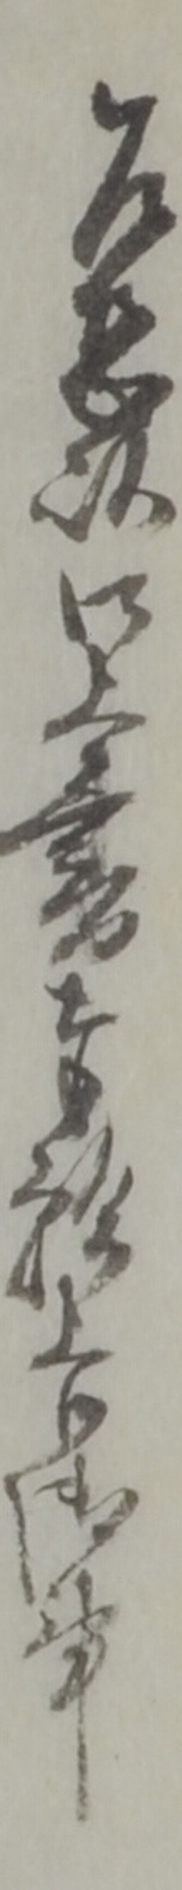乍恐以口上書奉願上候御事
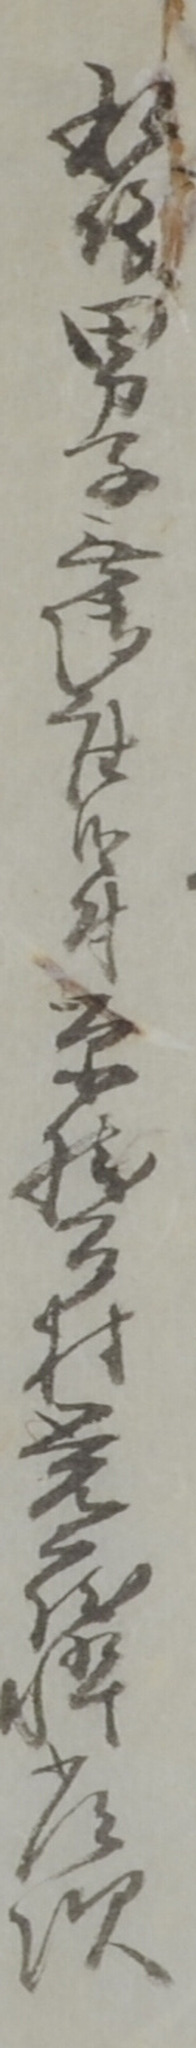私儀男子無御座候ニ付原勝間村覚蔵忰常次
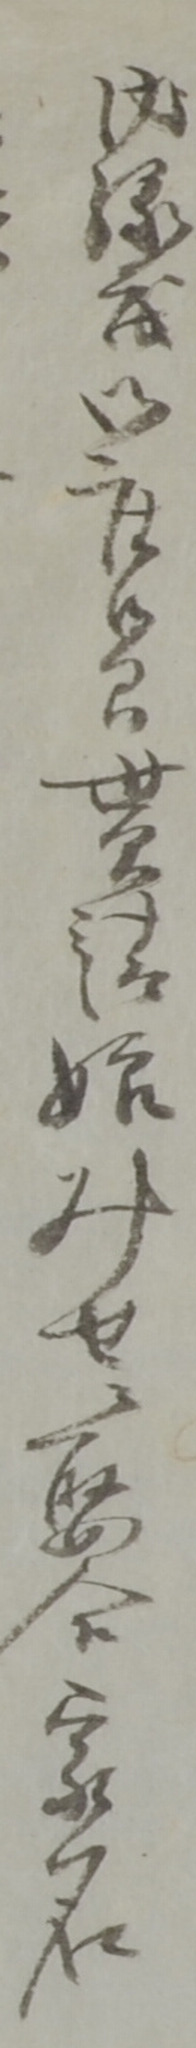内縁も御座候間貰請娘みせニ娶合家名
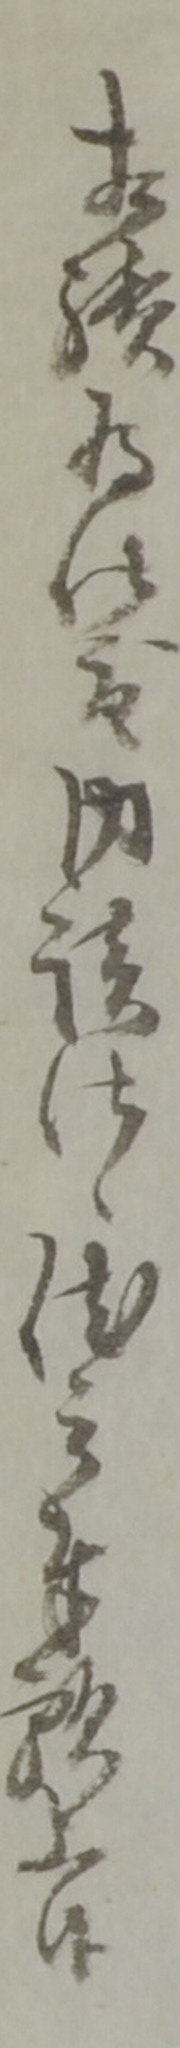相続為仕度内談仕候依之奉願上候
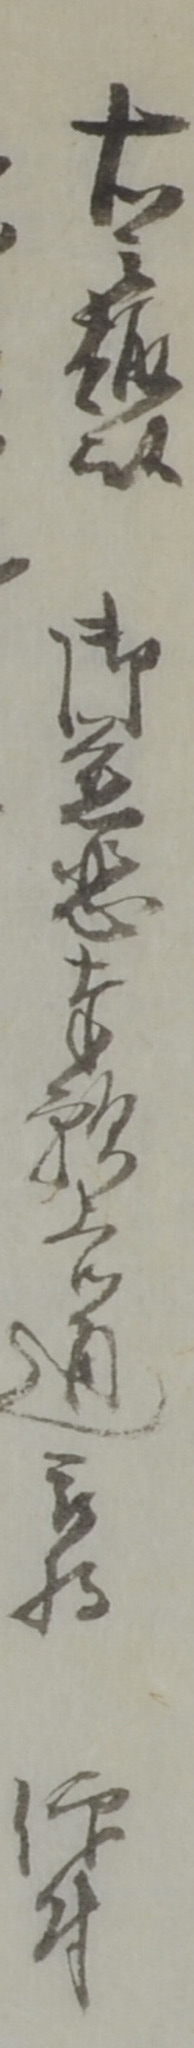右之趣以御慈悲奉願上候通被為仰付
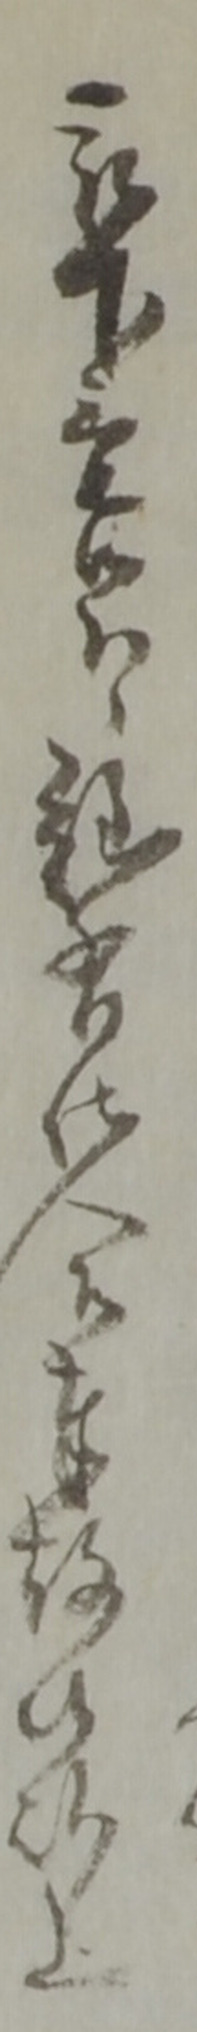被下置候ハヽ難有仕合奉存候以上
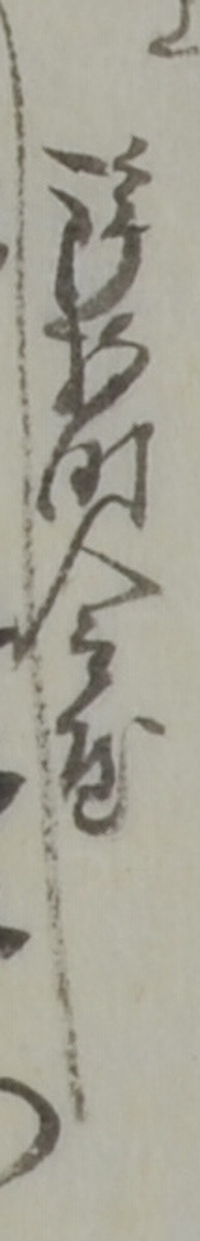鉾持町金屋
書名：諸願書控簿
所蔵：伊那市立高遠町図書館・合同会社AMANE
